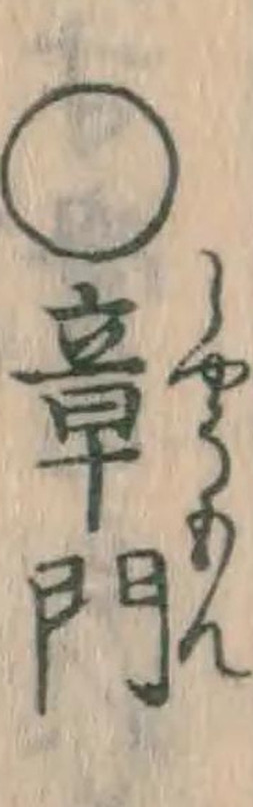○章門
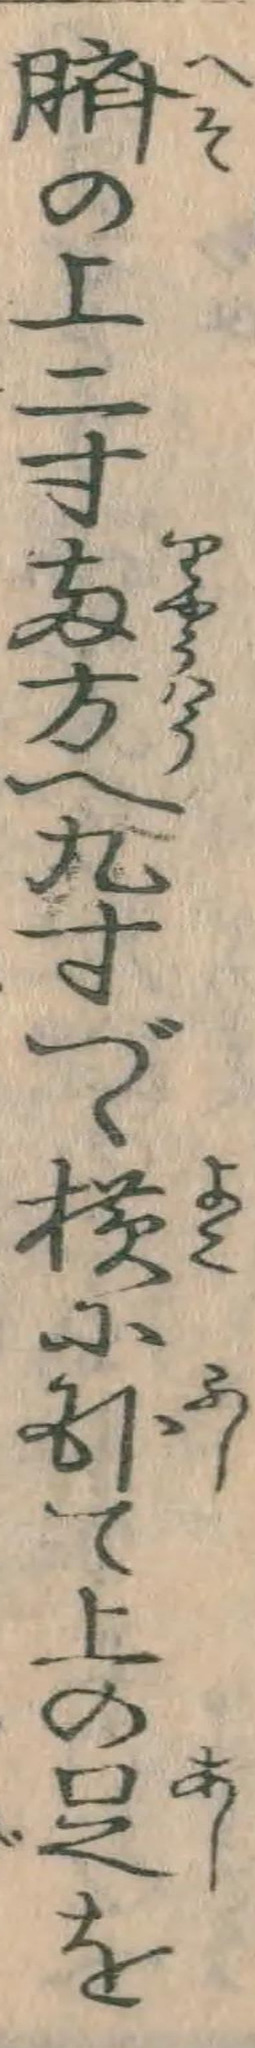臍の上二寸両方へ九寸づゝ横に臥て上の足を
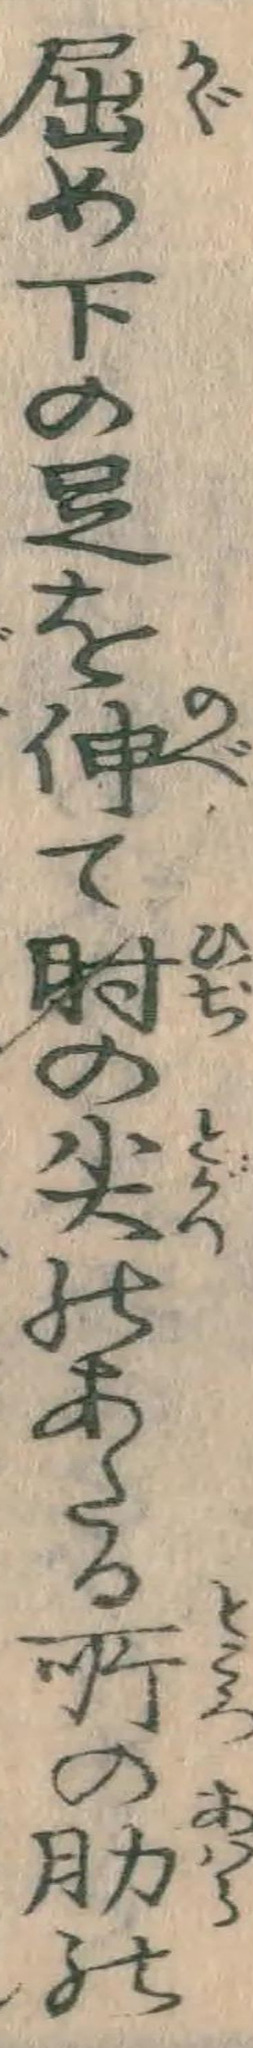屈め下の足を伸て肘の尖のあたる所の肋の
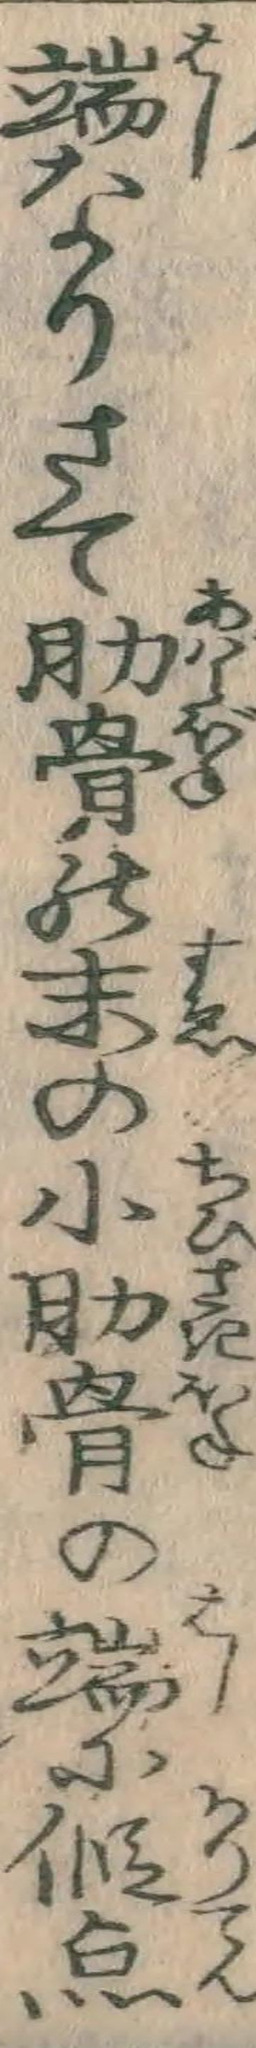端なりさて肋骨の末の小肋骨の端に仮点
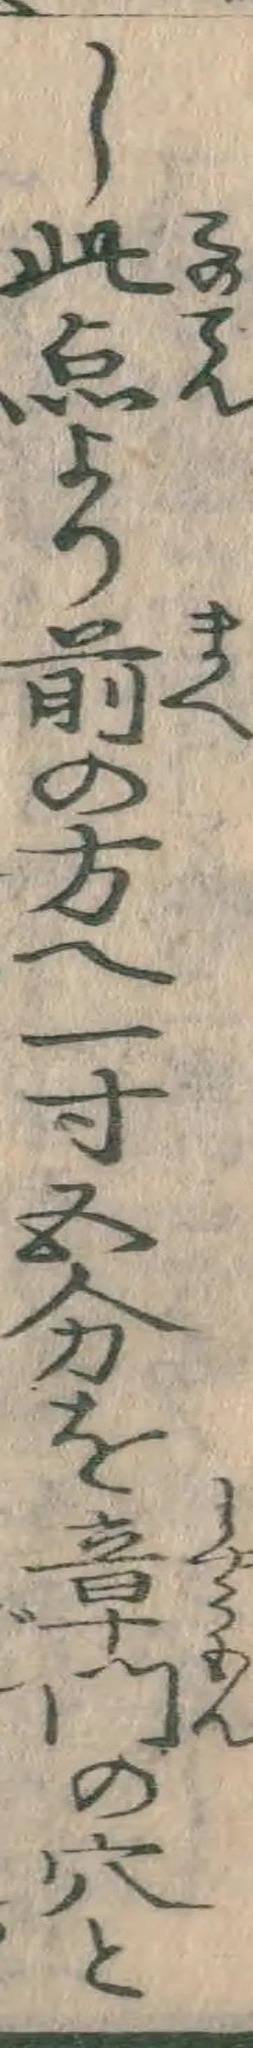し此点より前の方へ一寸五分を章門の穴と
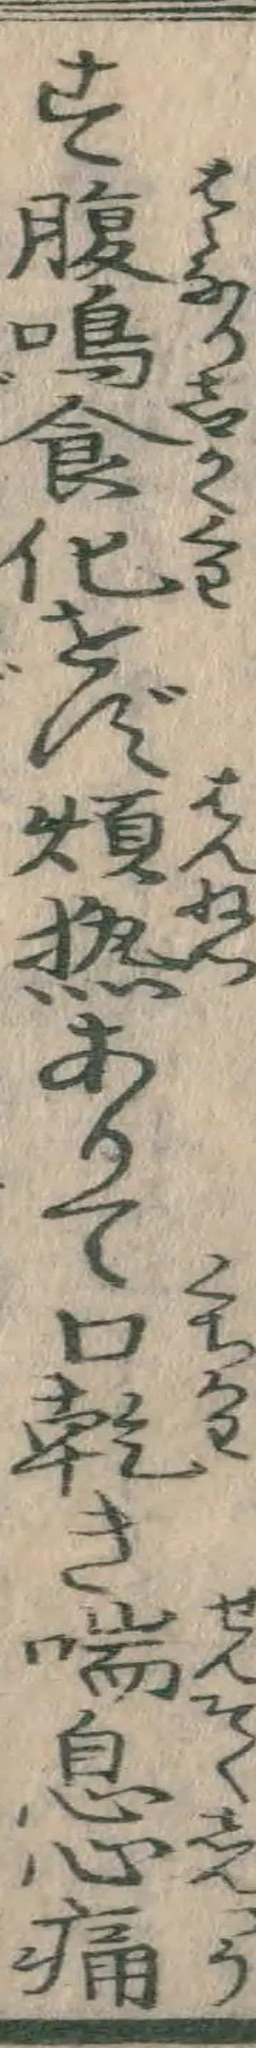す腹鳴食化せず煩熱ありて口乾き喘息心痛
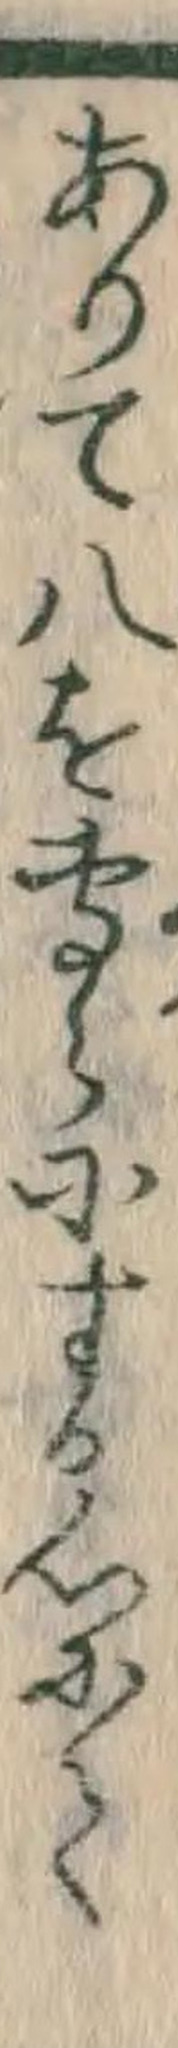ありて八を専らにする心にて
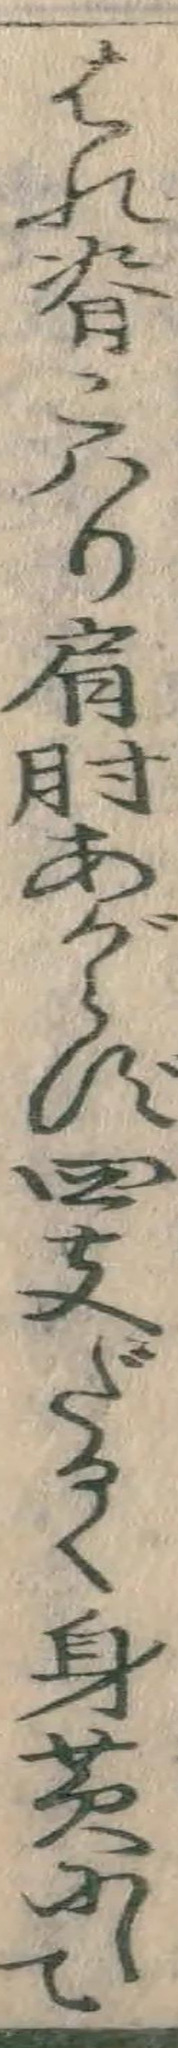はれ脊こはり肩肘あがらず四支だるく身黄にして
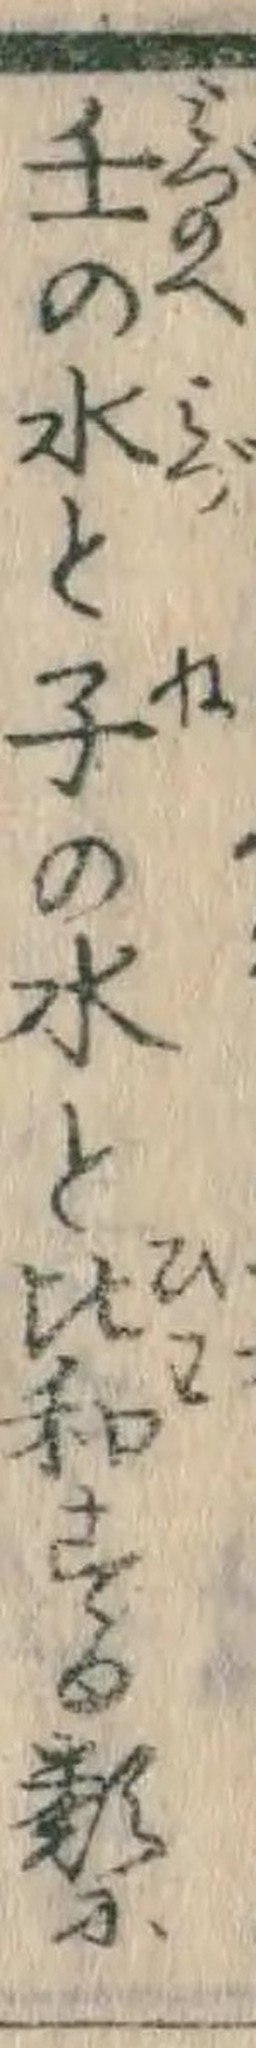壬の水と子の水と比和する類に
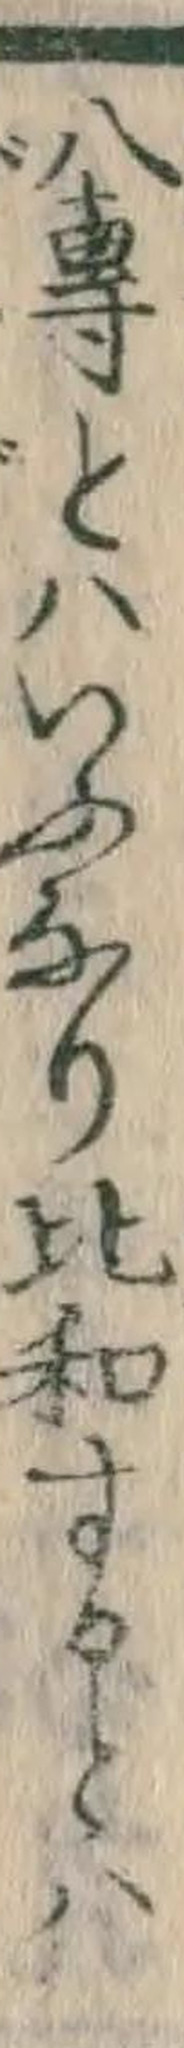八専とはいふなり比和するとは
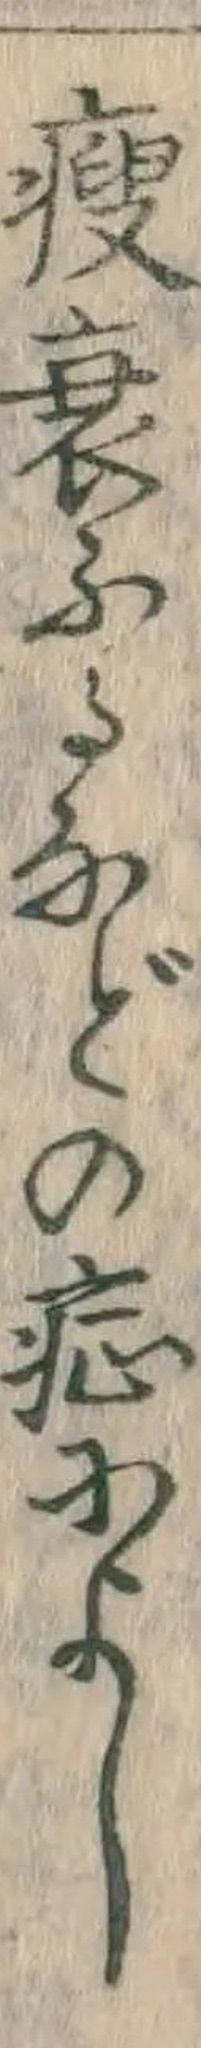痩衰ふるなどの症によし
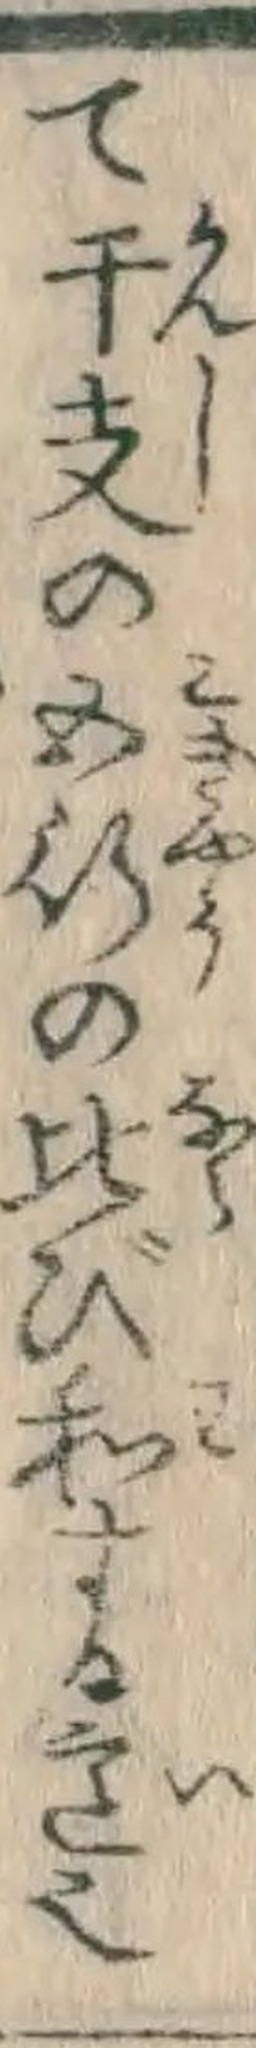て干支の五行の比び和する意也
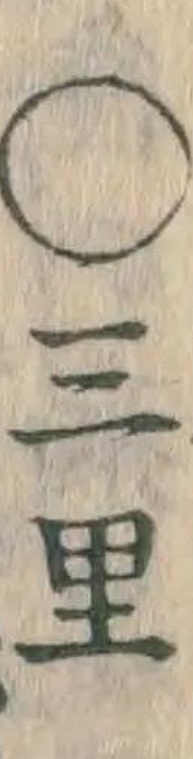○三里
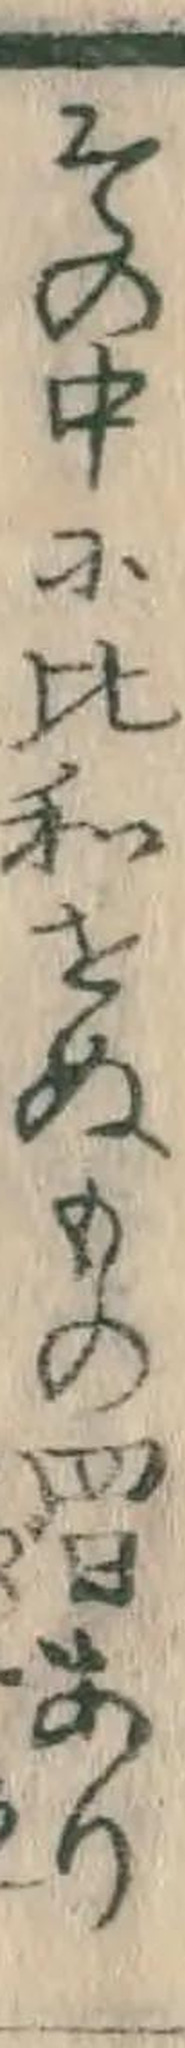その中に比和せぬもの四日あり
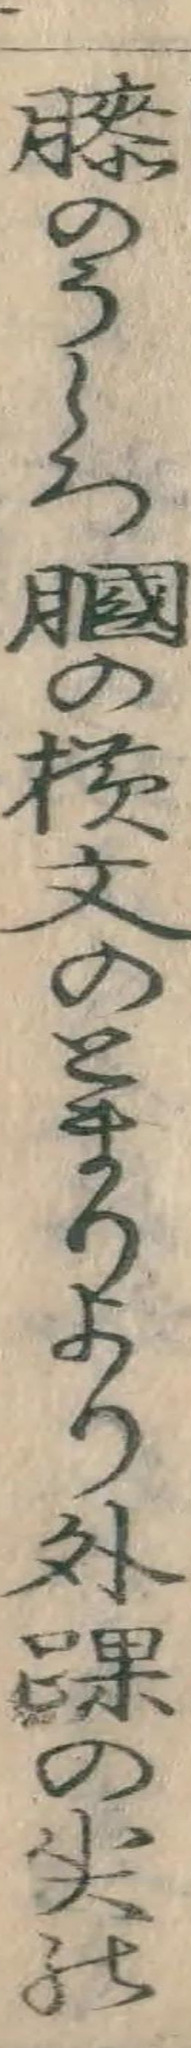膝のうしろ膕の横文のとまりより外踝の尖の
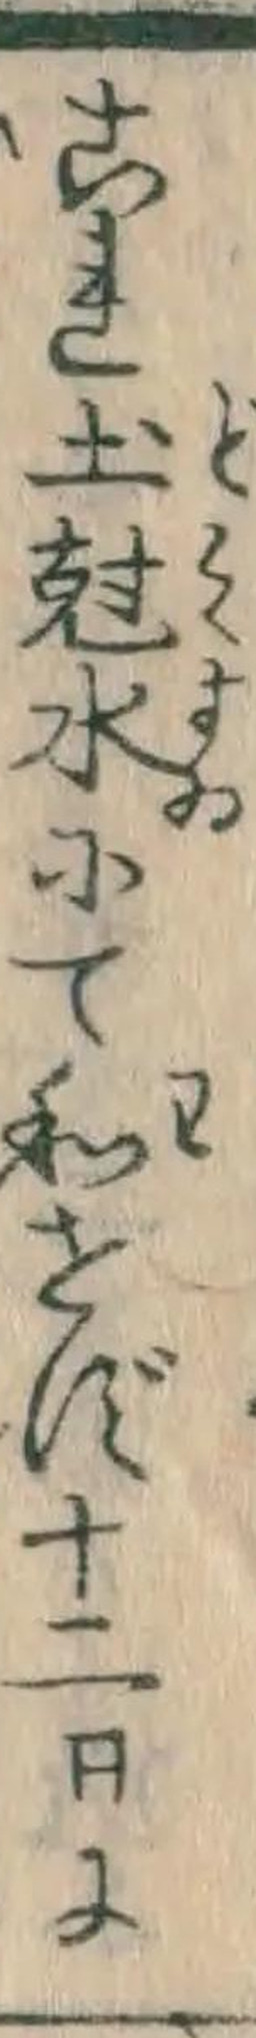これ土剋水にて和せず十二日に
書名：広益秘事大全 3巻. [4]
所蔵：国立国会図書館 National Diet Library, JAPAN
